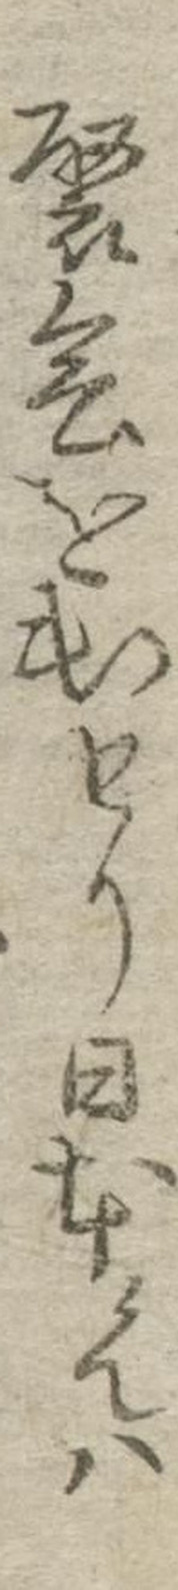聚会を出せり日本ニては
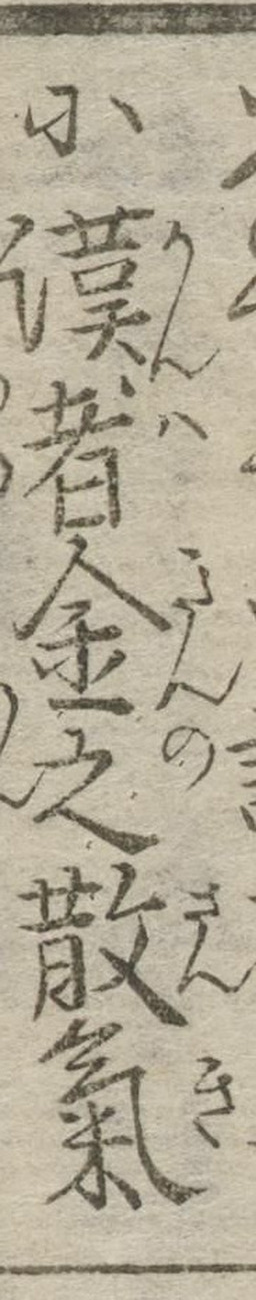に漢者金之散気
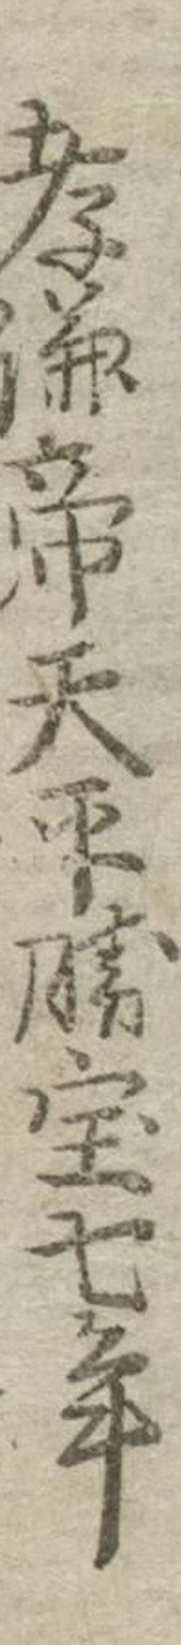孝謙帝天平勝宝七年
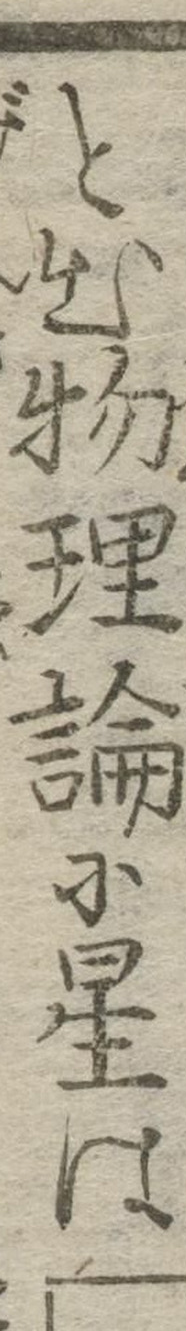と出物理論に星は
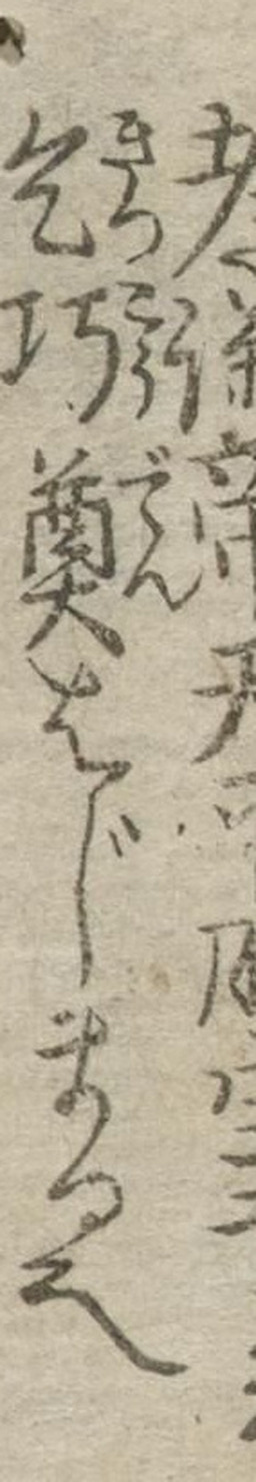乞巧奠はじまる也
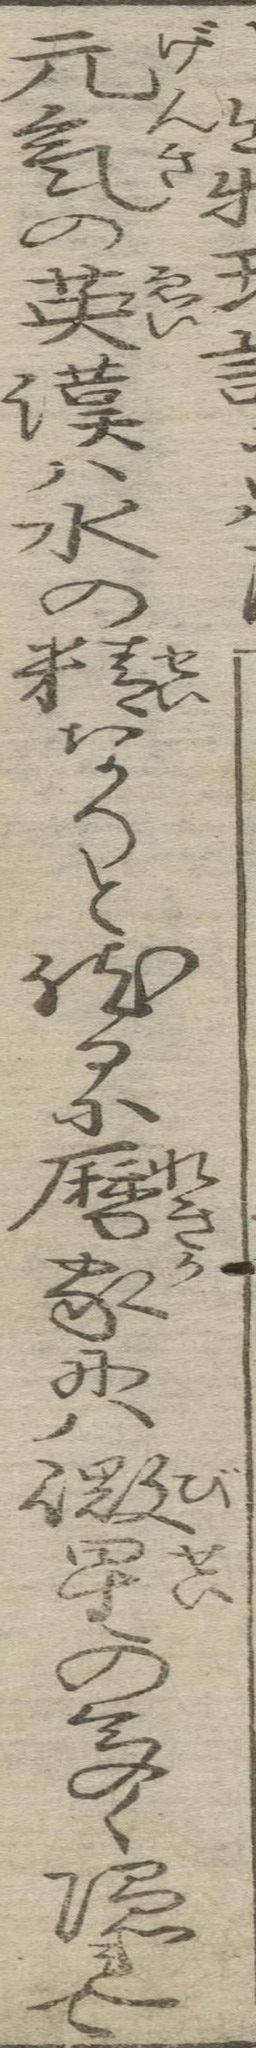元気の英漢は水の精なりと然るに暦家には微星の多く隠れて

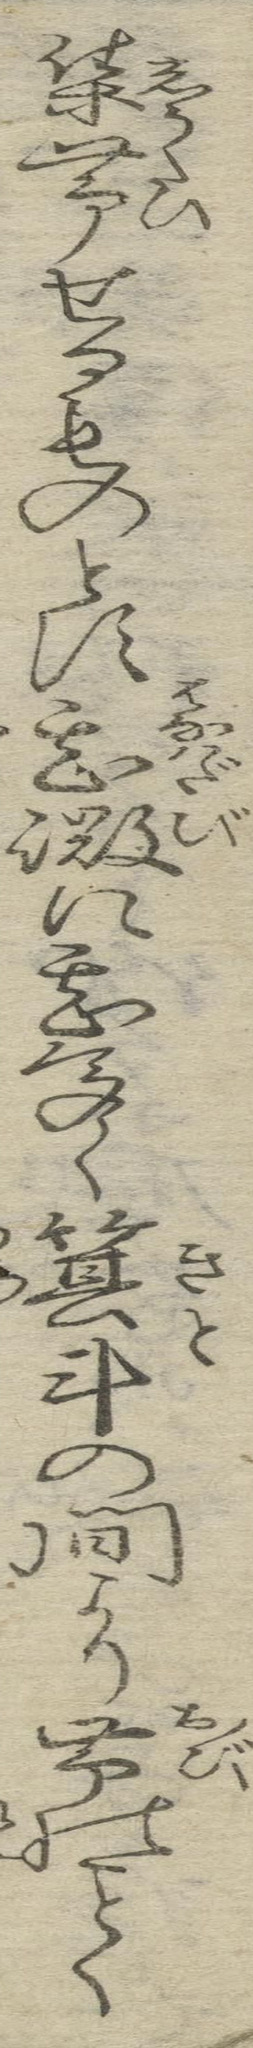集帯せるものとす甚微に甚多く箕斗の間より帯のことく
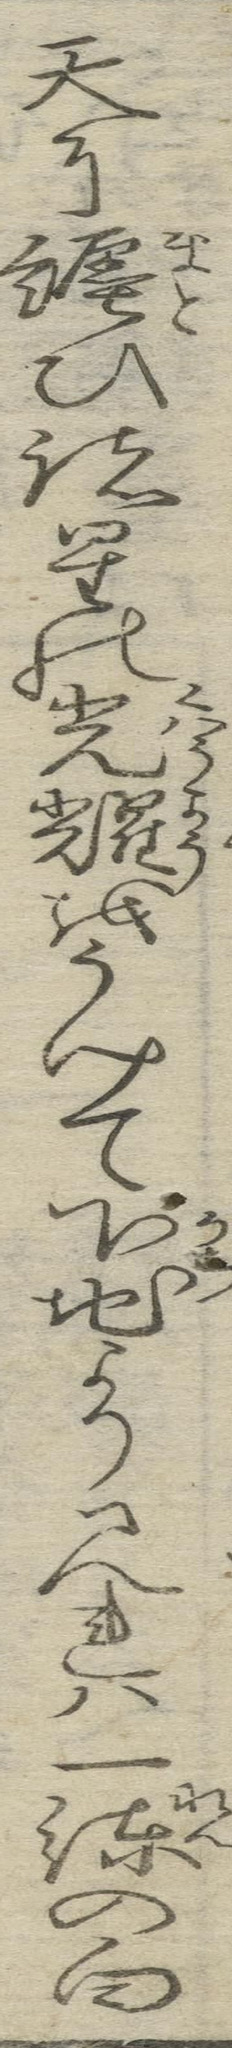天に纏ひ諸星の光耀をうけて下地より見れは一錬の向
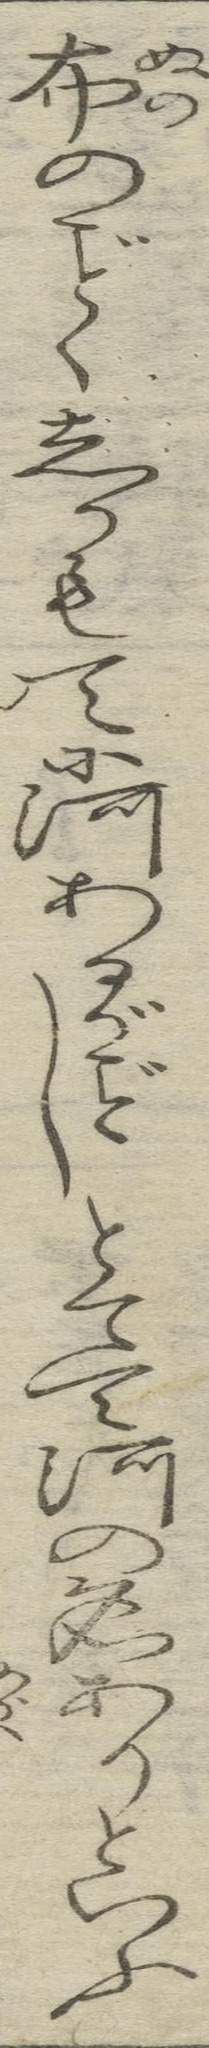布のごとくしかも天に河あるがごとしとて天河の名ありといふ
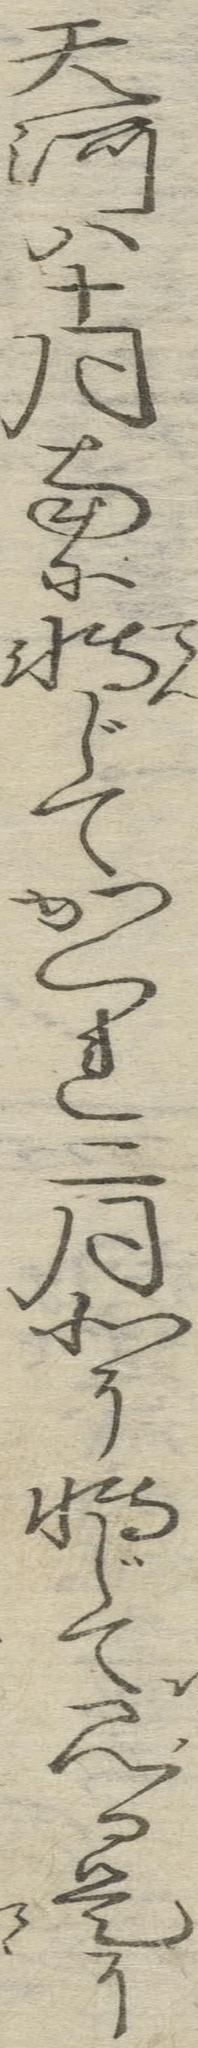天河は十月南に転じてかくれ二月北に転じて見る是に
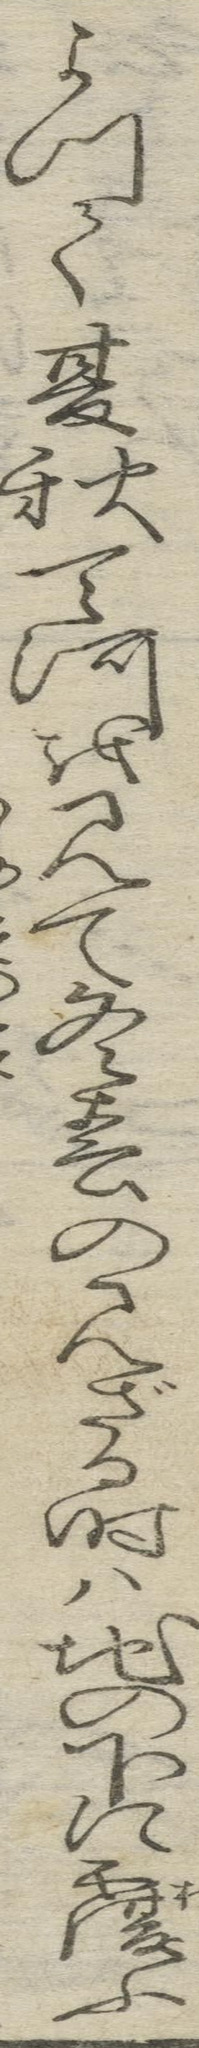よつて夏秋天河を見て冬春の見ざる時は地の下に覆ふ
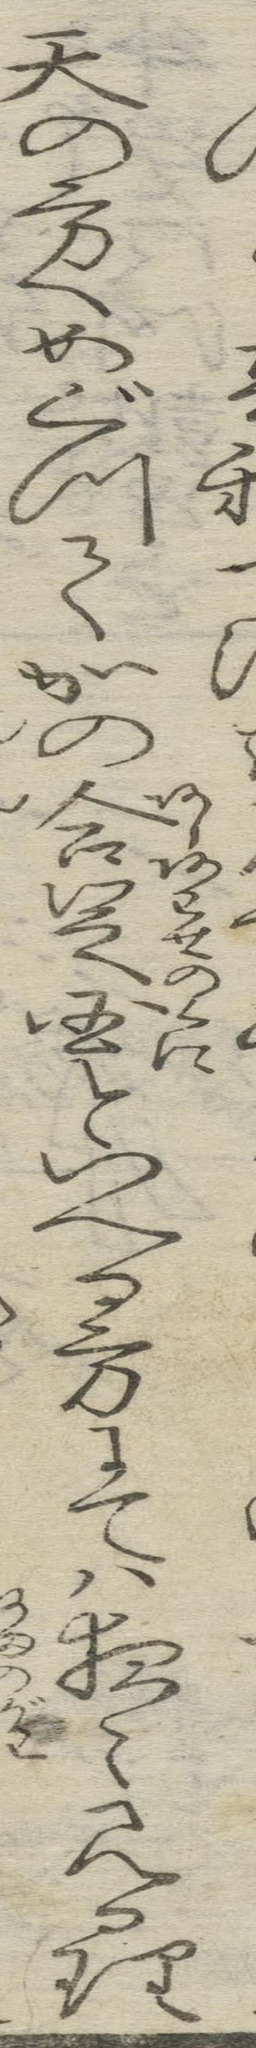天の方へめぐつてかの合足国といへる方にては夜〻見る理
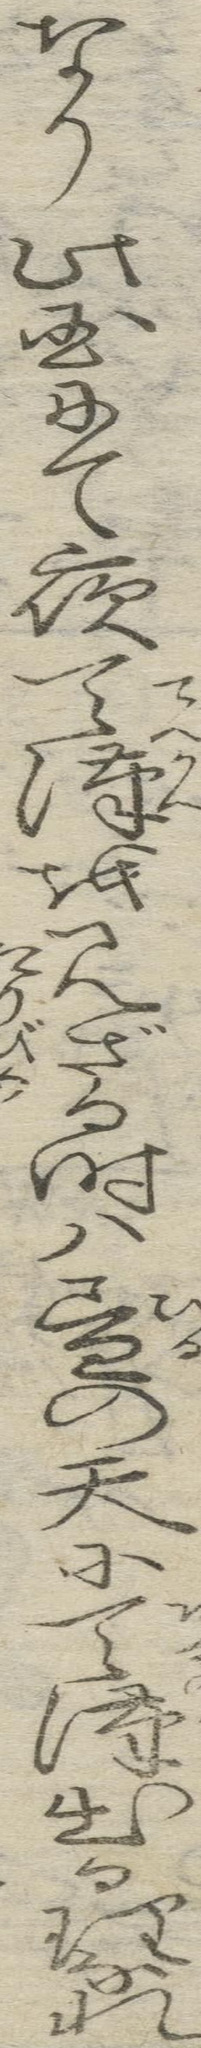なり此国にて夜天漢を見ざる時は昼の天に天漢出る理なれ
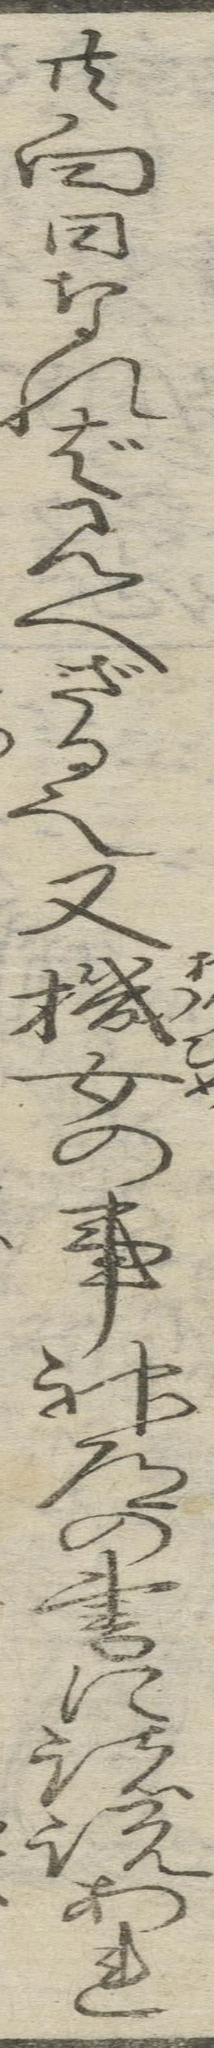共向日なれば見へざる也又織女の事神道の書に諸説あれ
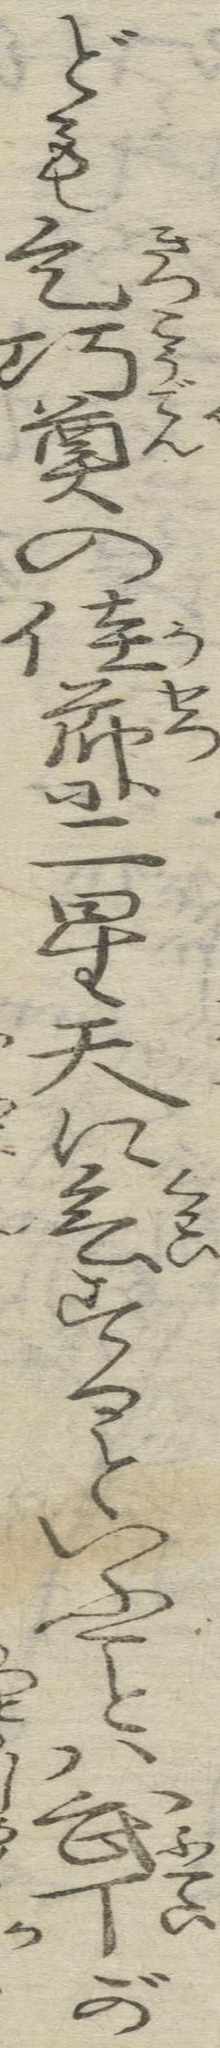ども乞巧奠の佳節に二星天に会するといふことは武丁が
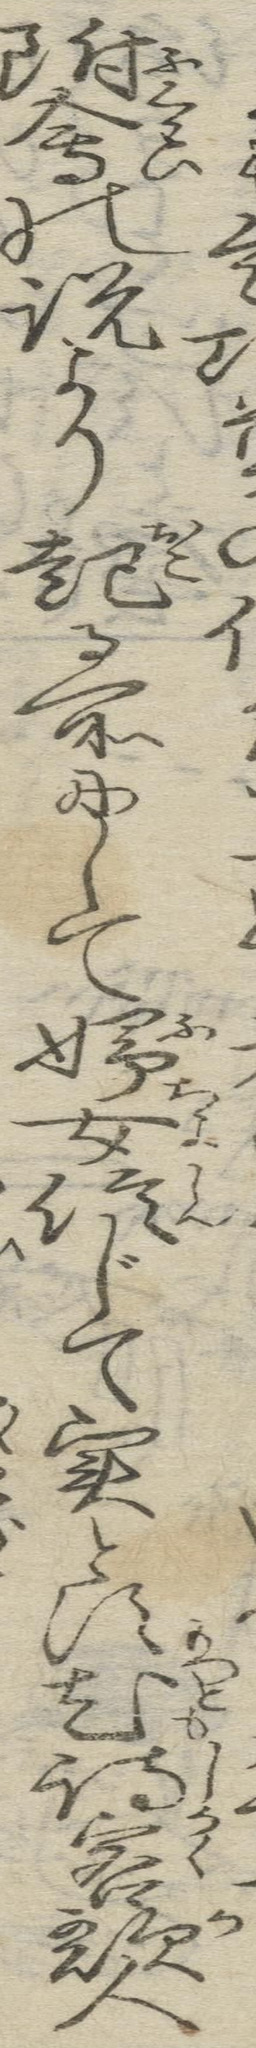附会の説より起る所にして婦女信じて実とす尤詩客歌人
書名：訓蒙天地辨　天
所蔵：東京大学地震研究所図書室 Earthquake Research Institute Library, The University of Tokyo, JAPAN
